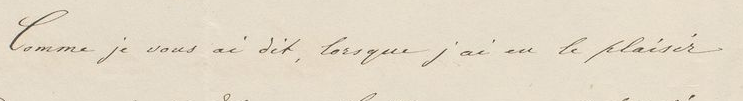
Comme je vous ai dit, lorsque j'ai eu le plaisir
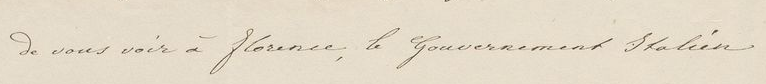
de vous voir à Florence, le Gouvernement Italien
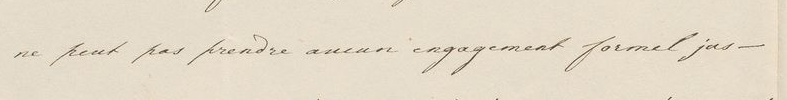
ne peut pas prendre aucun engagement formel jus-
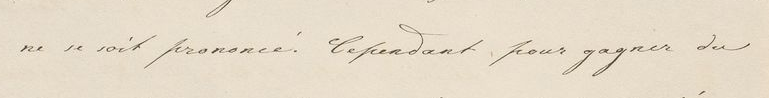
ne se soit prononcé. Cependant pour gagner du
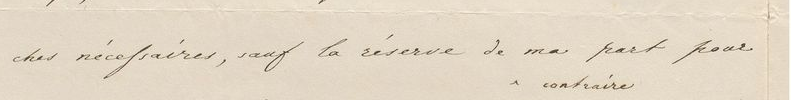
ches nécessaires, sauf la réserve de ma part pour
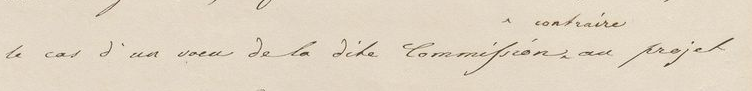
le cas d'un voeu de la dite Commission contraire au projet
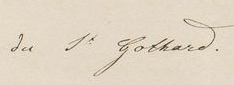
du St Gothard.
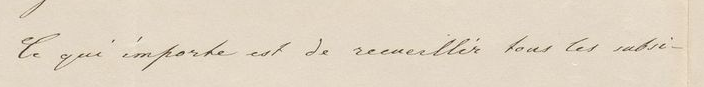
Ce qui importe est de recueillir tous les subsi-
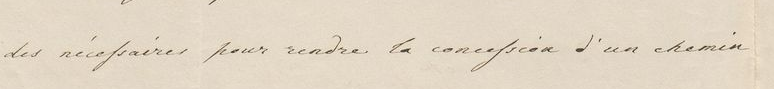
des nécessaires pour rendre la concession d'un chemin
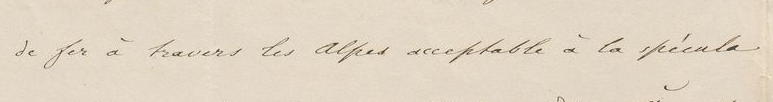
de fer à travers les Alpes acceptable à la spécula-
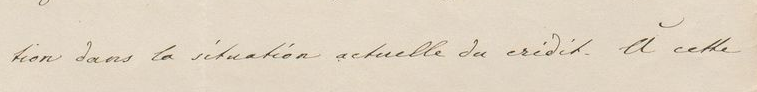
tion dans la situation actuelle du crédit. À cette
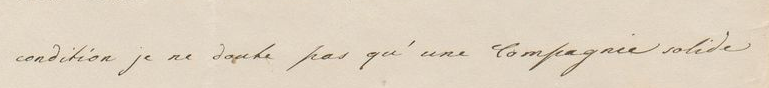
condition je ne doute pas qu'une compagnie solide
